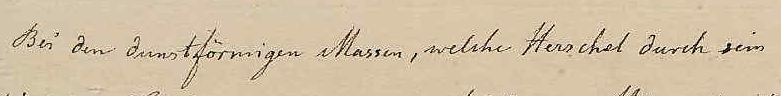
Bei den dunstförmigen Massen, welche Herschel durch sein
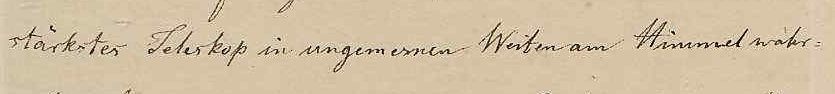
stärkstes Teleskop in ungemesnen Weiten am Himmel wahr-
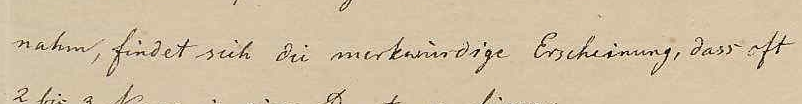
nahm, findet sich die merkwürdige Erscheinung, dass oft
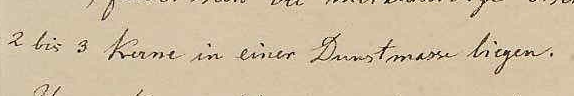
2 bis 3 Kerne in einer Dunstmasse liegen.
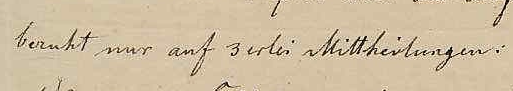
beruht nur auf 3erlei Mittheilungen:
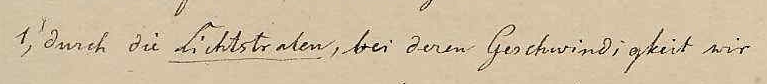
1, durch die Lichtstralen, bei deren Geschwindigkeit wir
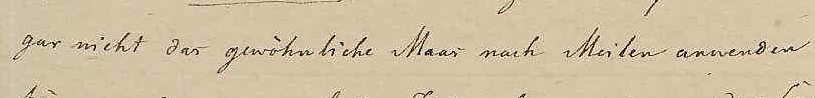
gar nicht das gewöhnliche Maas nach Meilen anwenden
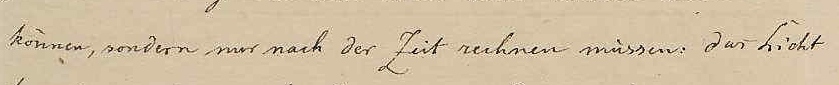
können, sondern nur nach der Zeit rechnen müssen: das Licht
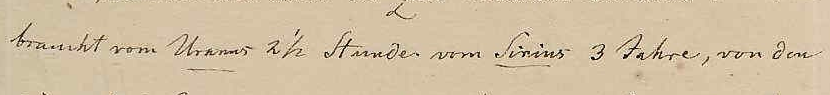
braucht vom Uranus 2½ Stunden vom Sirius 3 Jahre, von den
